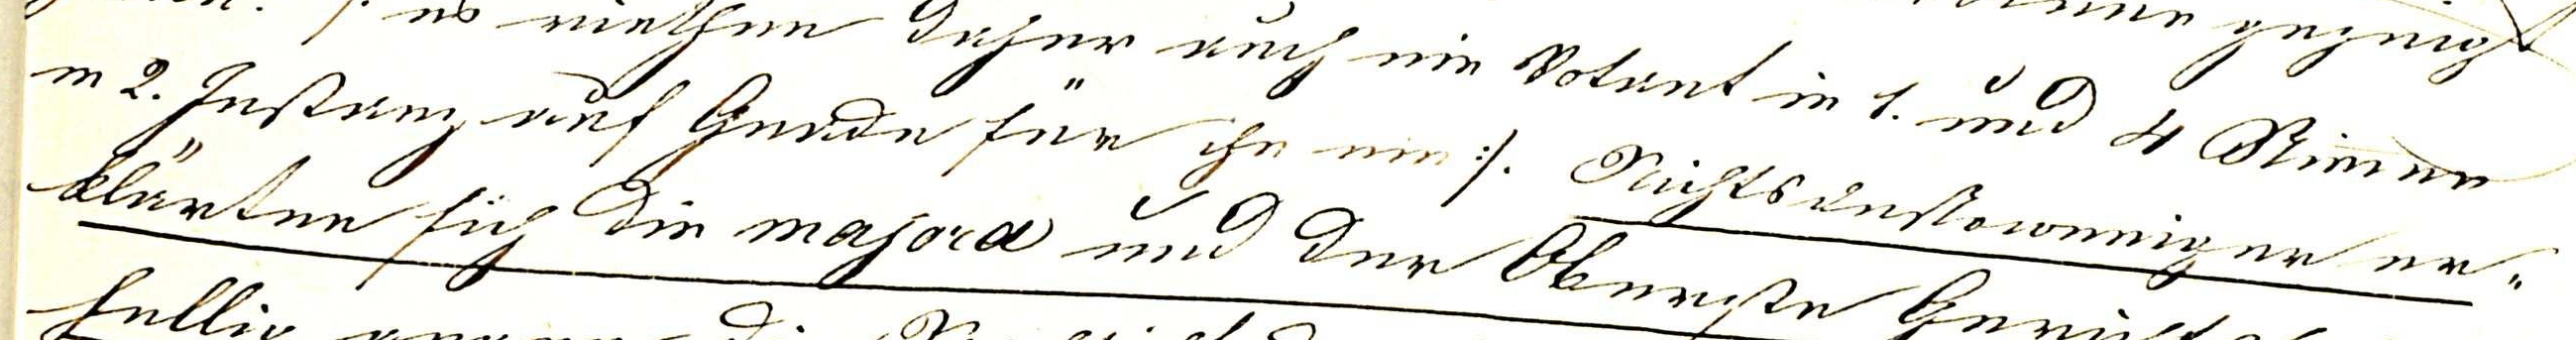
in 2. Instanz auf Gnade für ihn um). Nichts destoweniger er¬
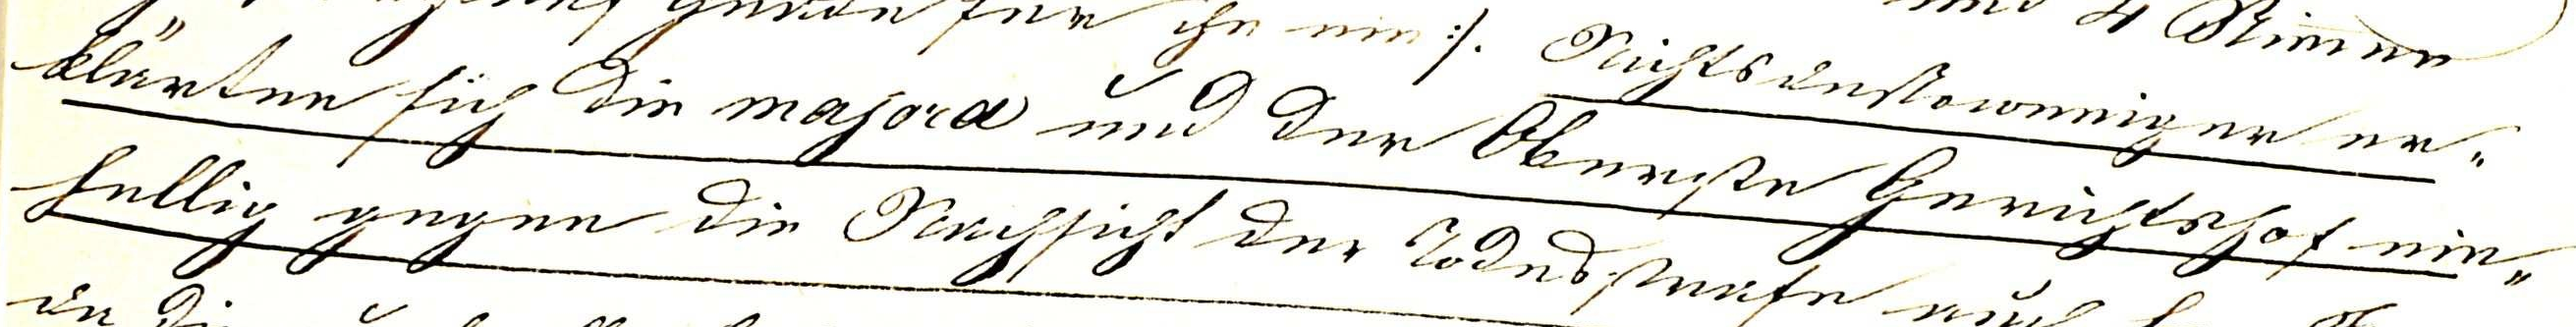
klärte sich die majora und der Oberste Gerichtshof ein¬
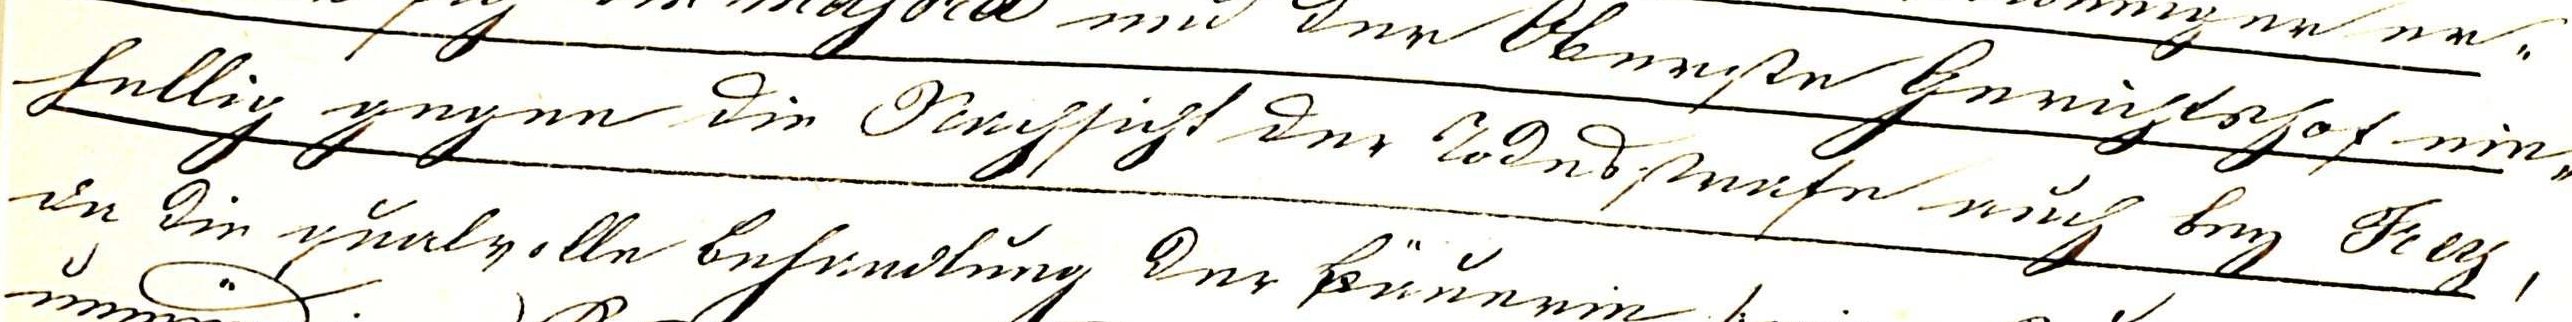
hellig gegen die Nachsicht der Todesstrafe auch bey Frey,
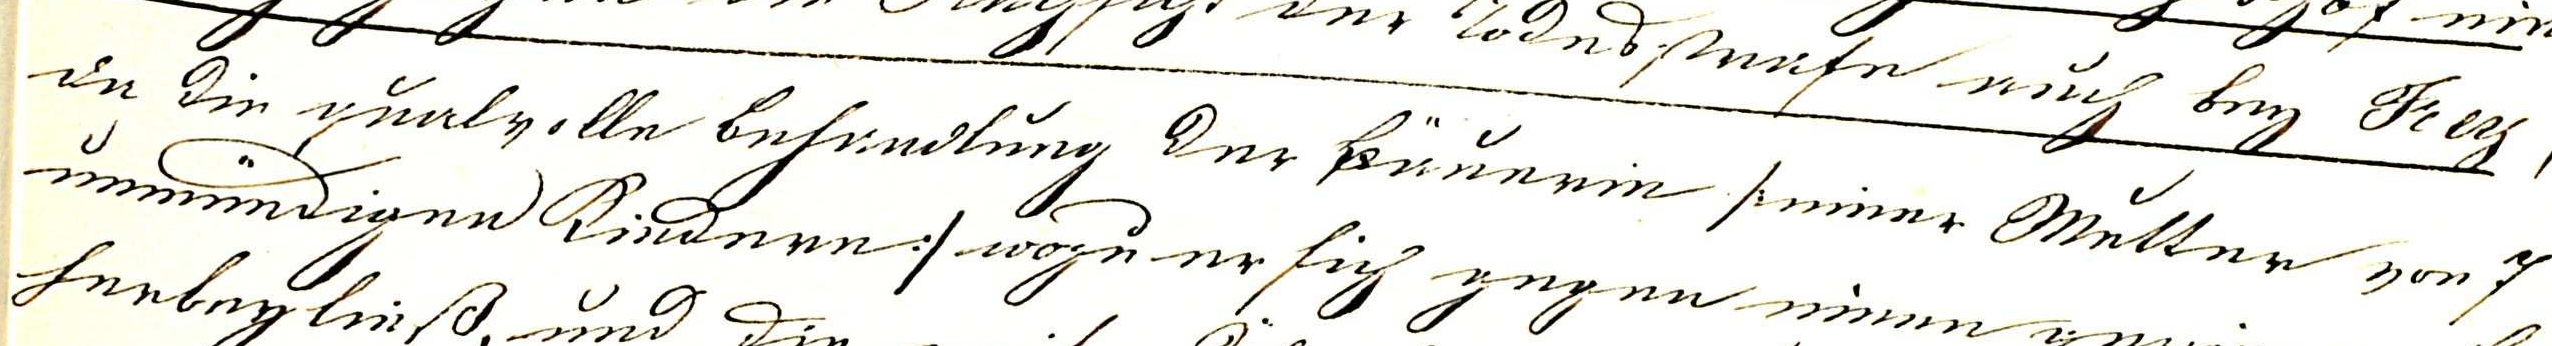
da die qualvolle Behandlung der Bäuerin (einer Mutter von 7
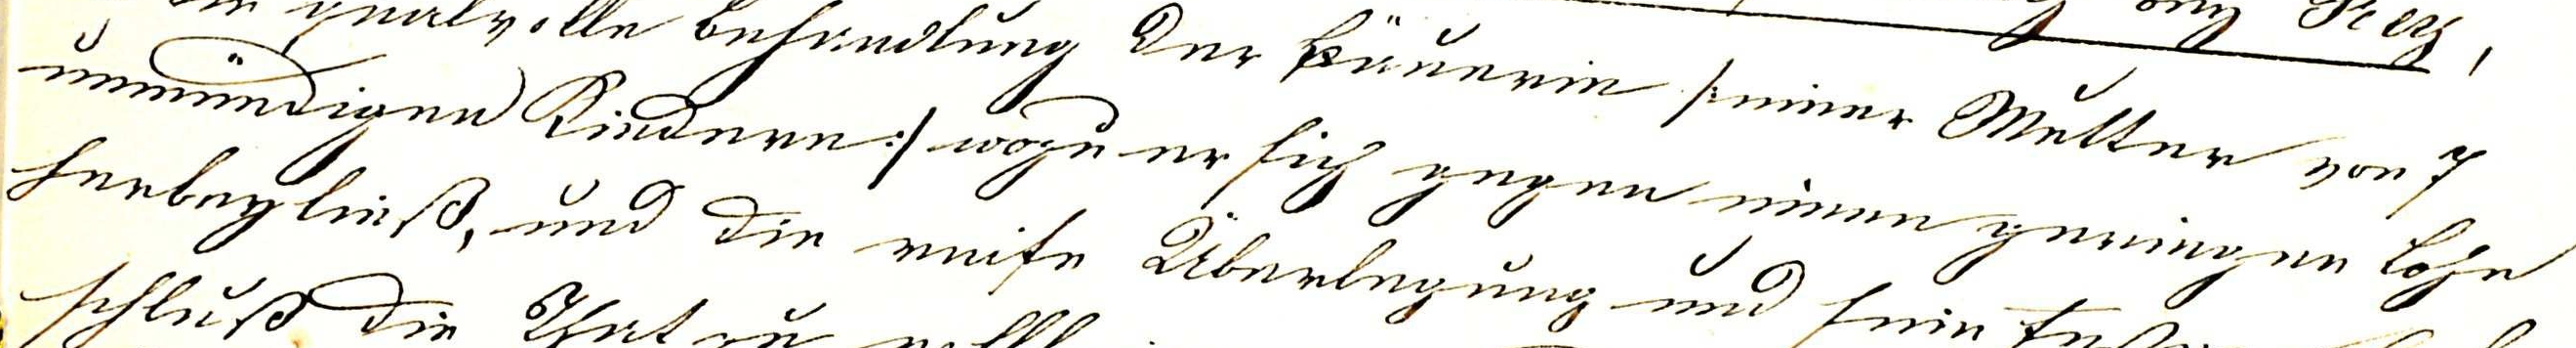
unmündigen Kindern) wozu er sich gegen einen geringen Lohn
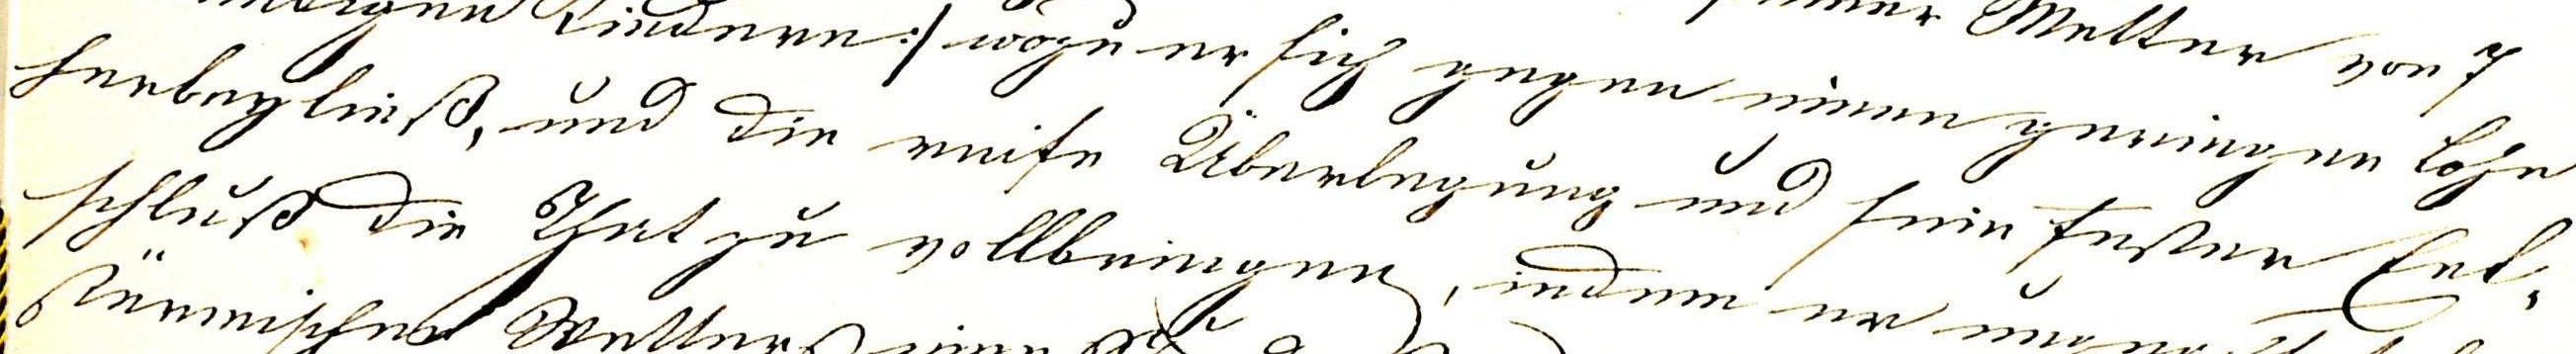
herbey lies, und die reife Überlegung und sein fester Ent¬
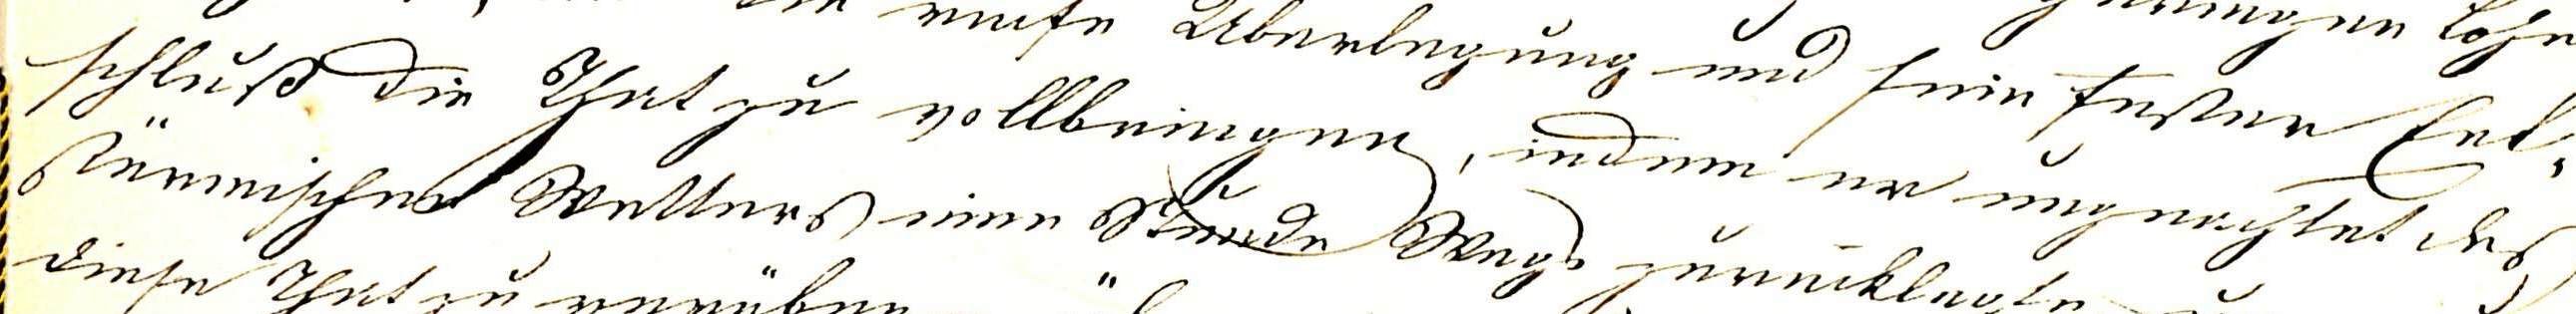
schluß die That zu vollbringen, indem er ungeachtet des
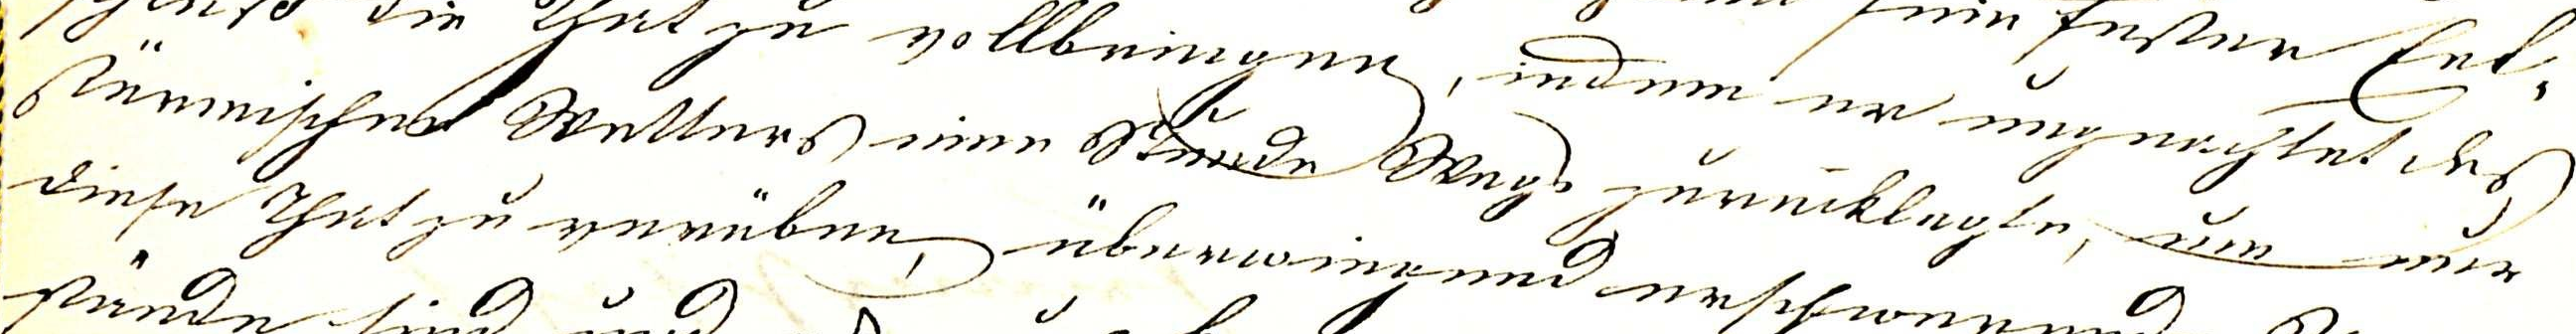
stürmischen Wetters eine Stunde Wegs zurücklegte, um nur
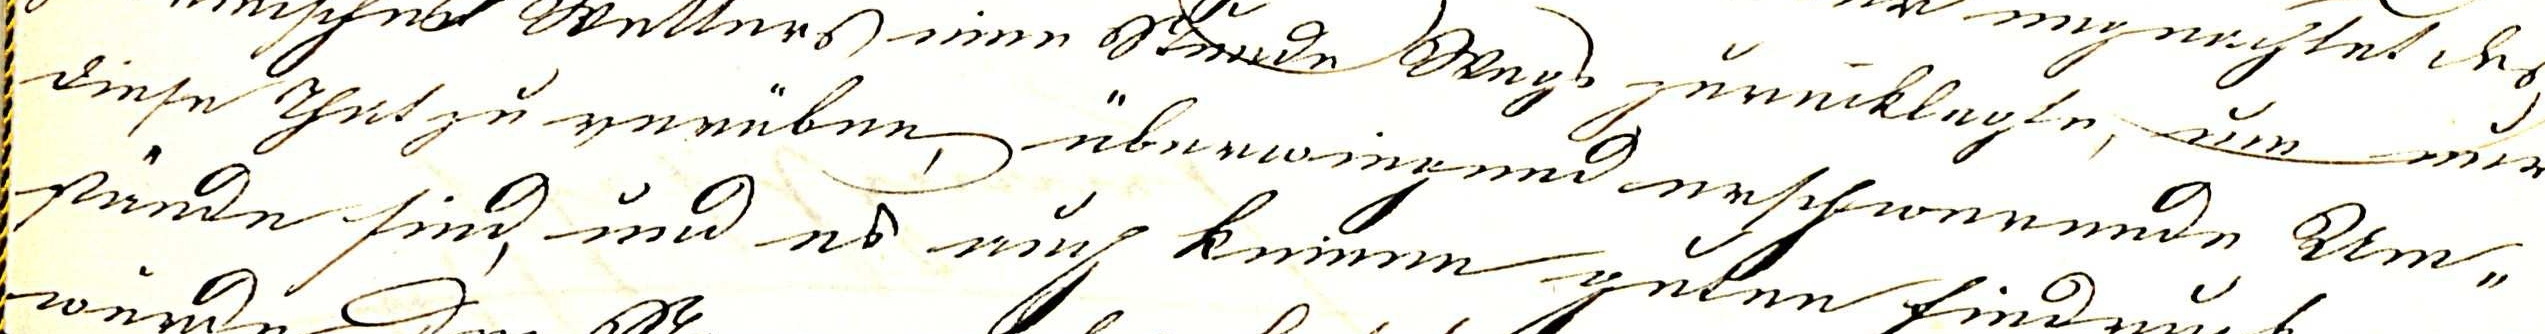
diese That zu verüben, überwiegend erschwerende Um¬
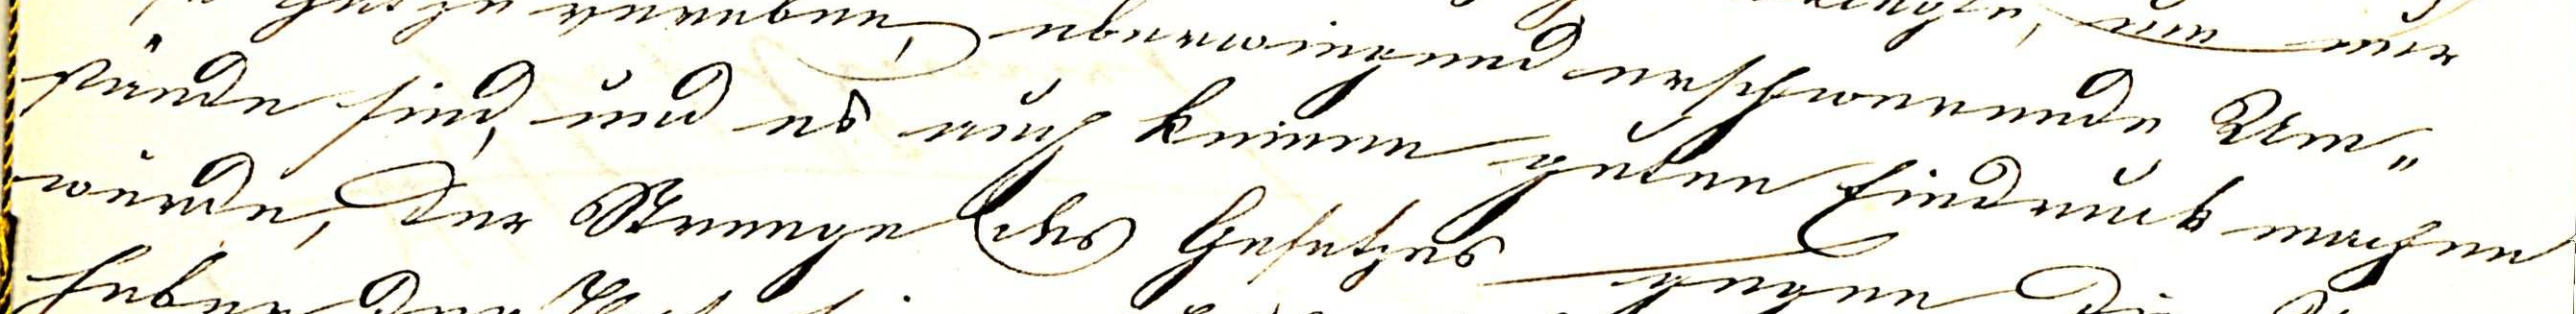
stünde sind, und es auch keinen guten Eindrunb machen
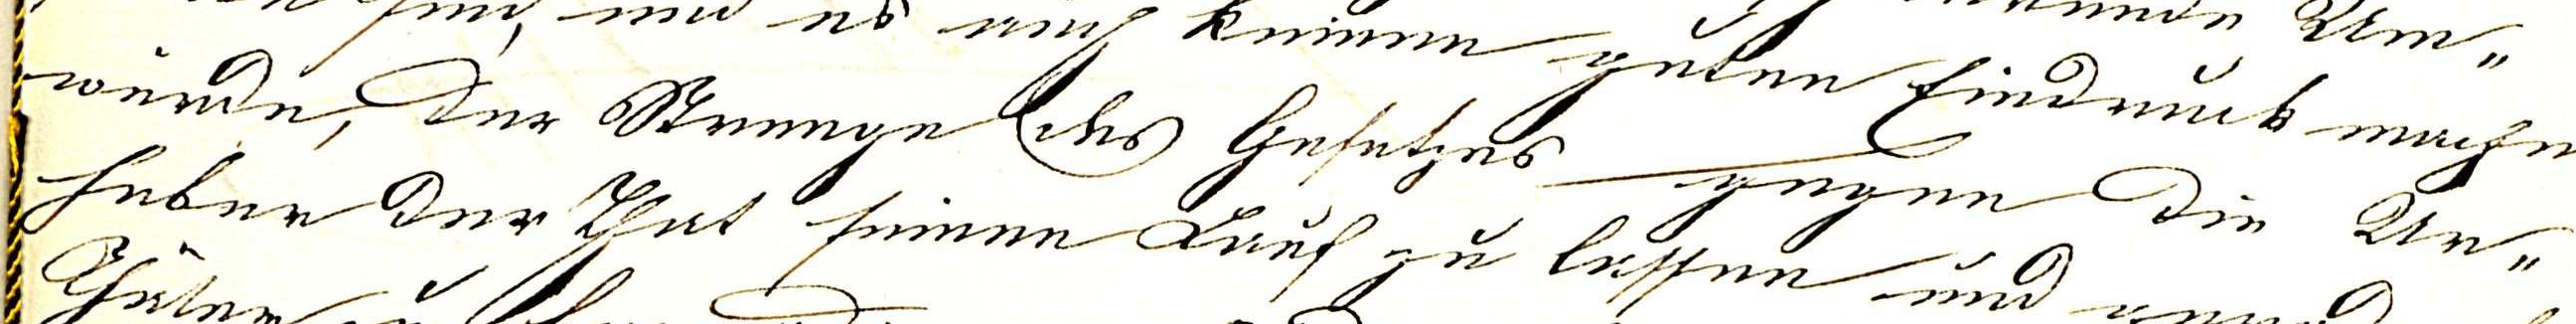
wurde, Der Strenge des Gesetzes gegen Die Ur¬
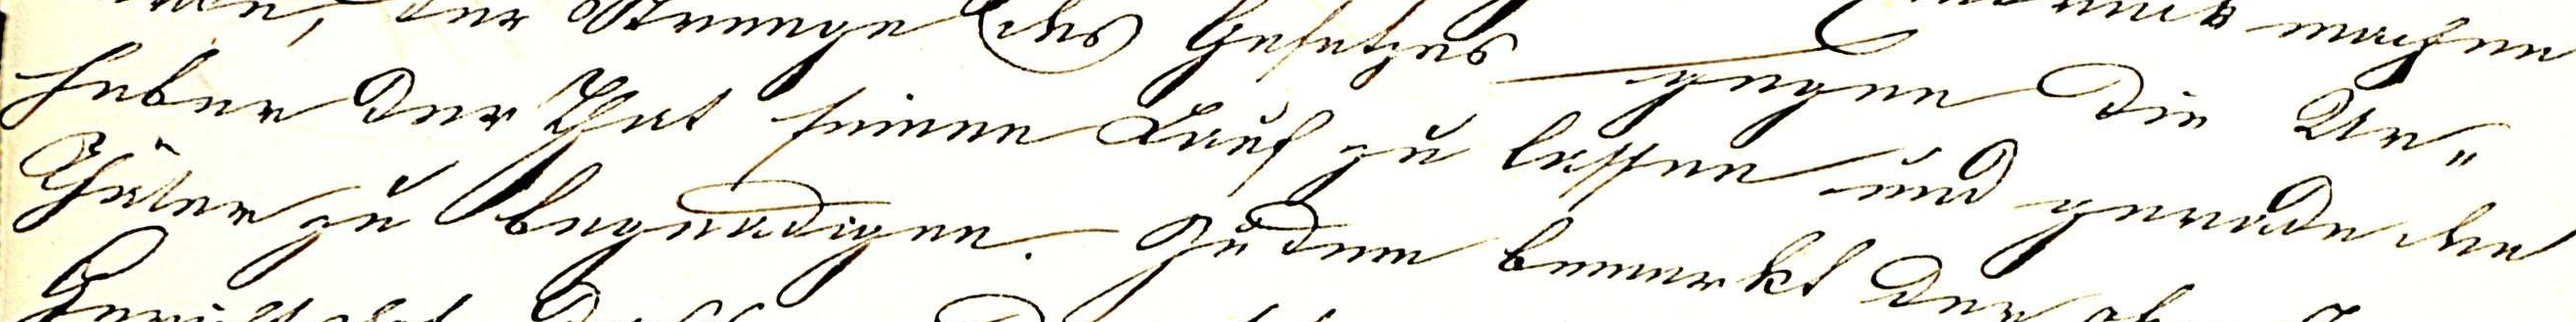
heber der That seinen Lauf zu lassen und gerade den
